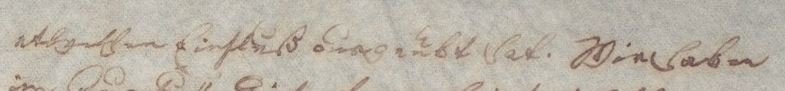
etwelchen Einfluß ausgeübt hat. Wir haben
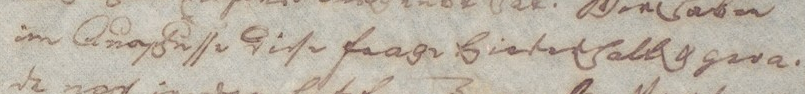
im Ausschusse diese Frage wiederholt & gera-
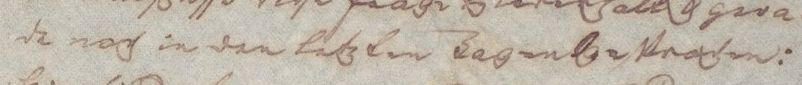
de noch in den letzten Tagen besprochen:
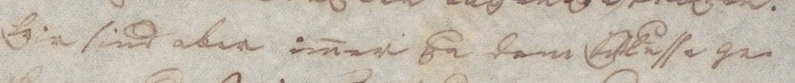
Wir sind aber immer zu dem Schlusse ge-
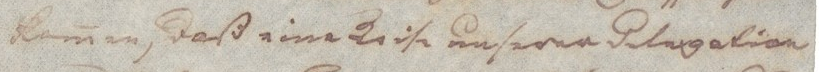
kommen, daß eine Reise unserer Delegation
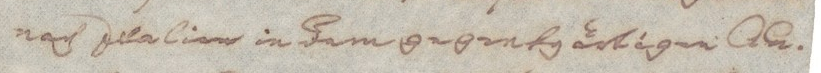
nach Italien in dem gegenwärtigen Au-
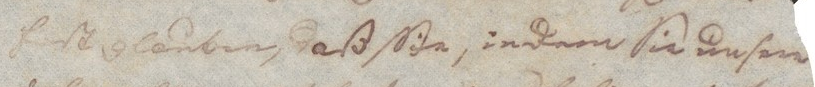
fast glauben, daß Sie, indem Sie unsere
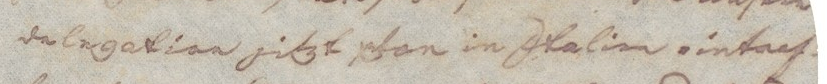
Delegation jetzt schon in Italien eintref-
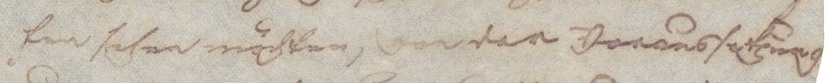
fen sehen möchten, von der Voraussetzung
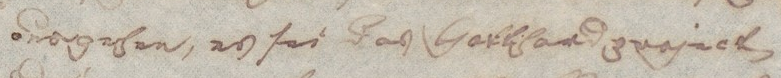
ausgehen, es sei das Gotthardproject
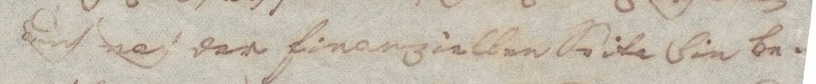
auch nach der finanziellen Seite hin be-
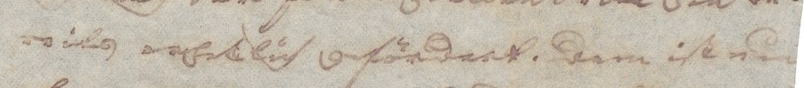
reits erheblich gefördert. Dem ist nun
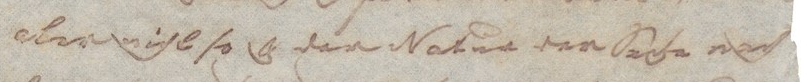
aber nicht so & der Natur der Sache nach
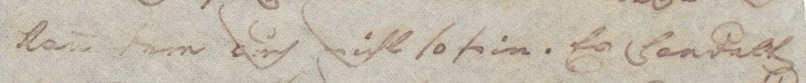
kann dem auch nicht so sein. Es handelt
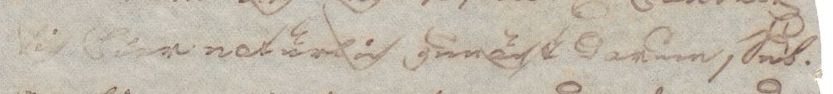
sich hier natürlich zunächst darum, Sub-
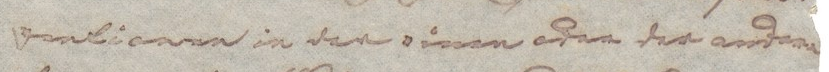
ventionen in der einen oder der andern
